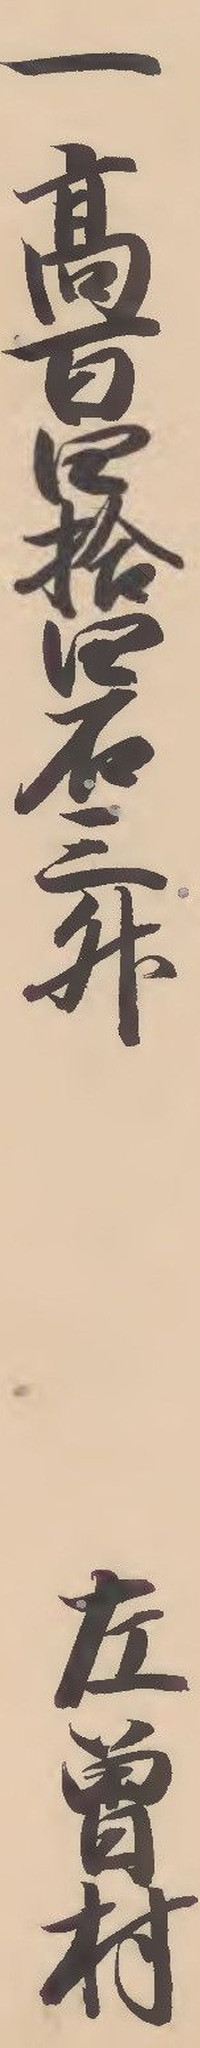一高百四拾四石三升左曽村

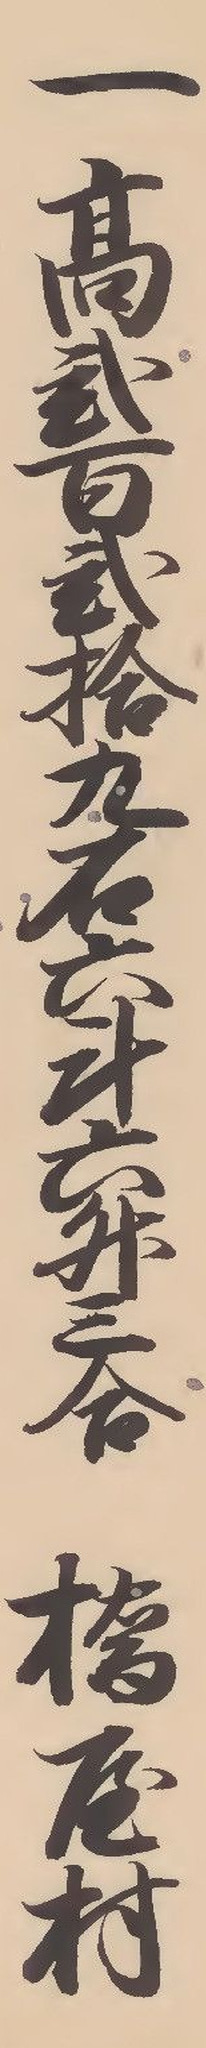一高弐百弐拾九石六斗六升三合橋屋村
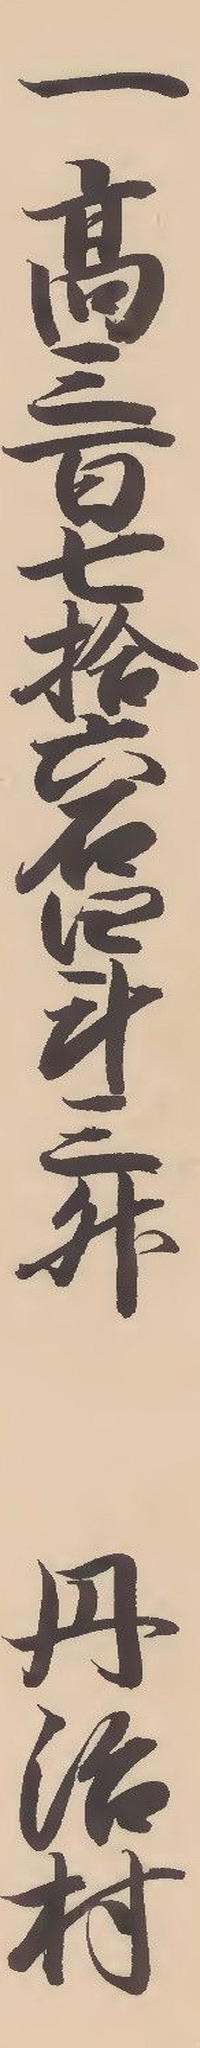一高三百七拾六石四斗三升丹治村
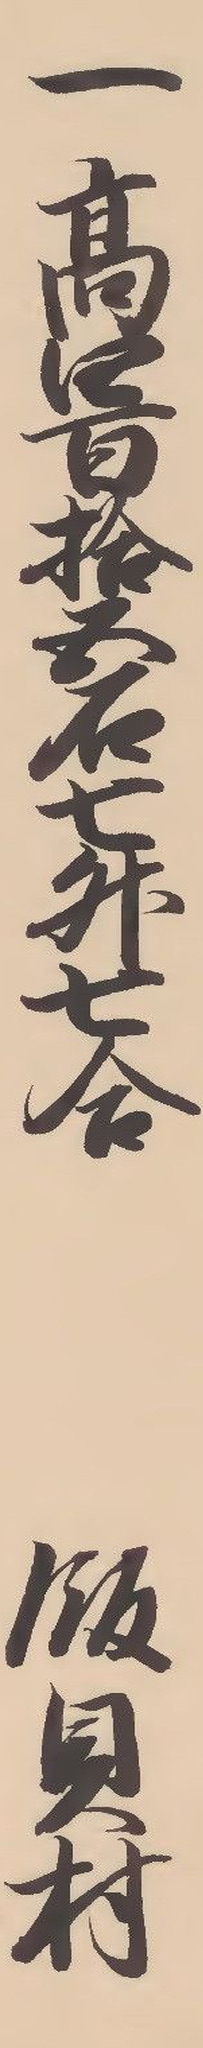一高四百拾五石七升七合飯貝村
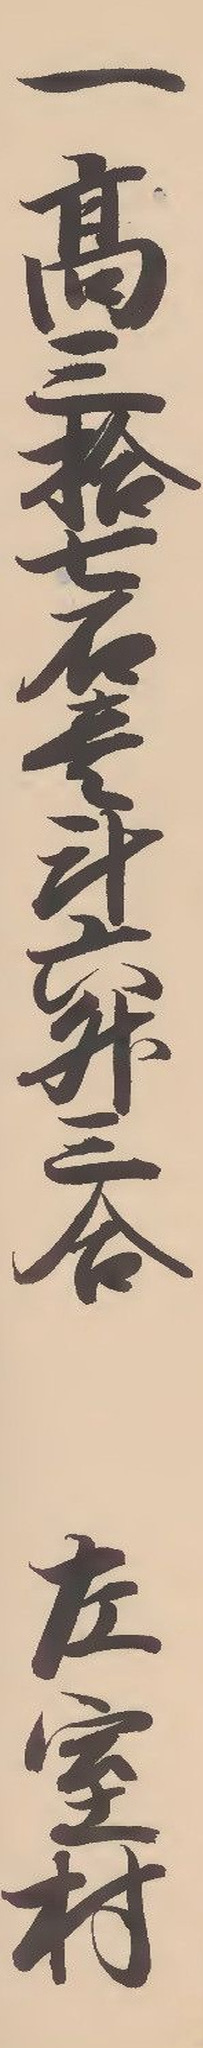一高三拾七石壱斗六升三合左室村
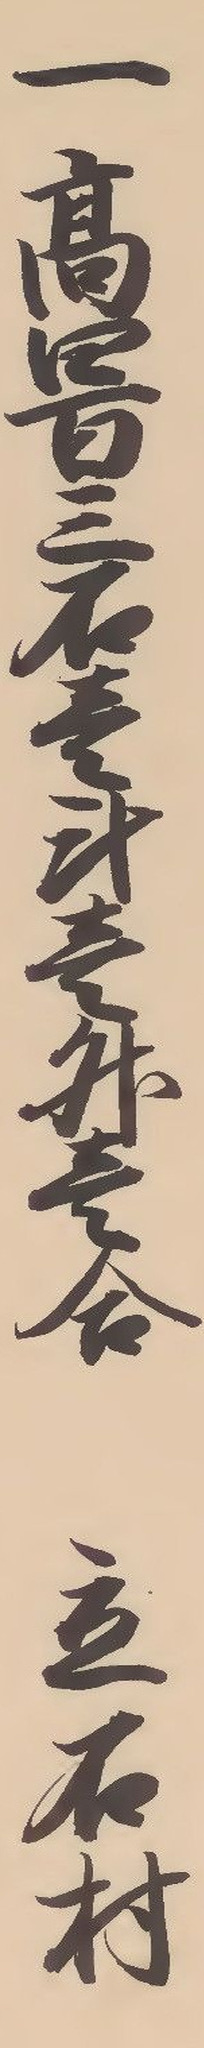一高四百三石壱斗壱升壱合立石村
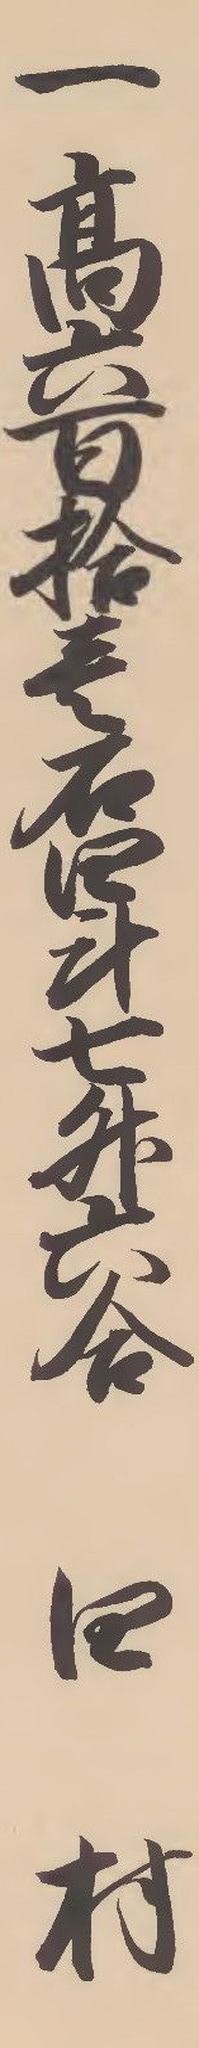一高六百拾壱石四斗七升六合四村
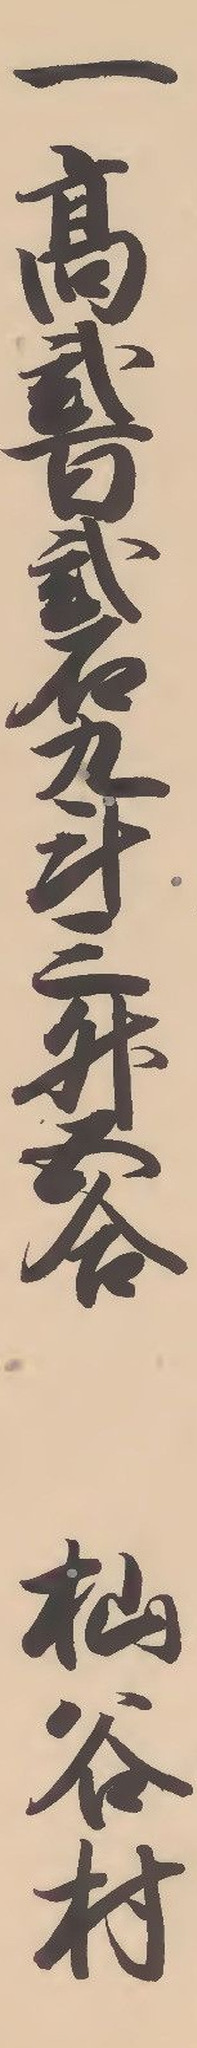一高弐百弐石九斗三升五合杣谷村

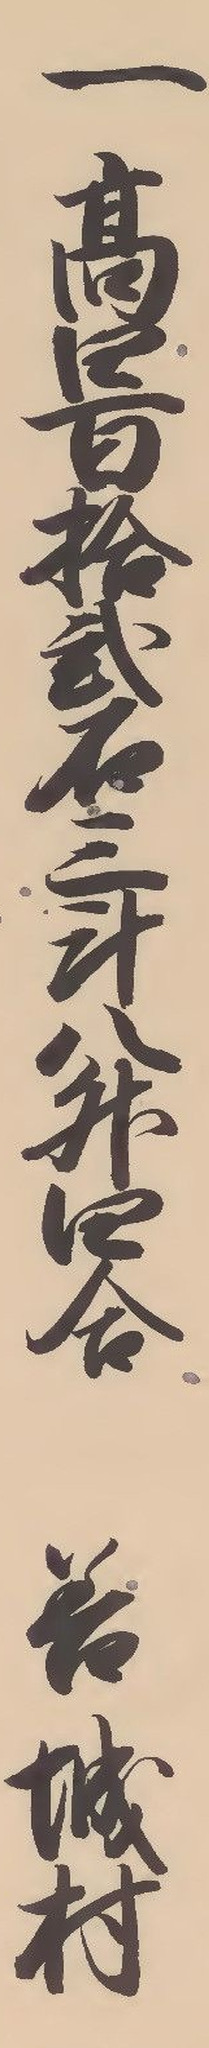一高四百拾弐石三斗八升四合善城村
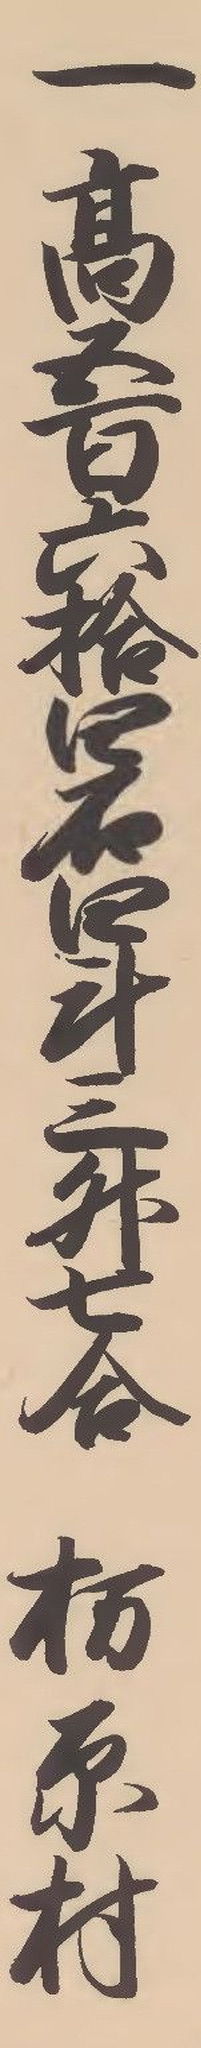一高五百六拾四石四斗三升七合栃原村
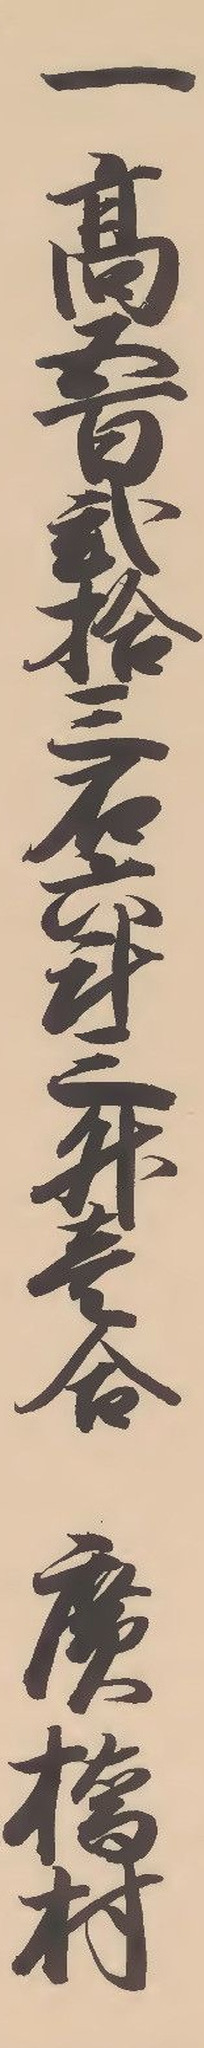一高五百弐拾三石六斗三升壱合広橋村
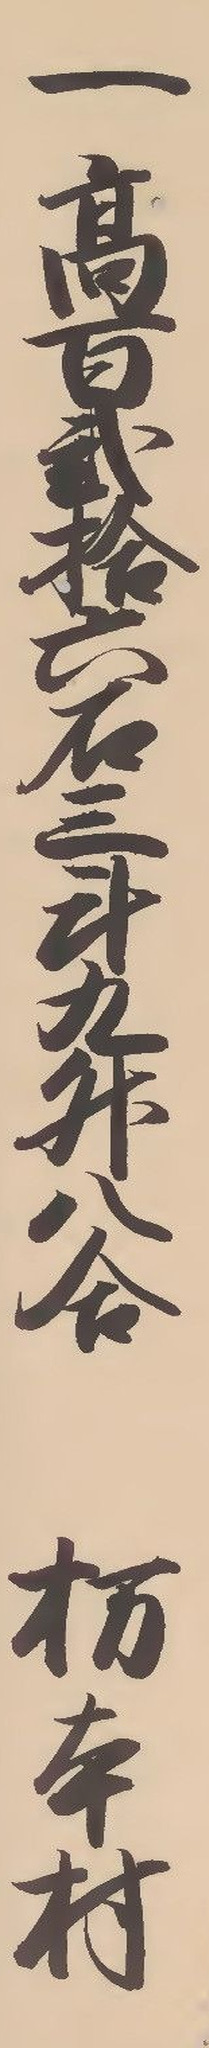一高百弐拾六石三斗九升八合栃本村
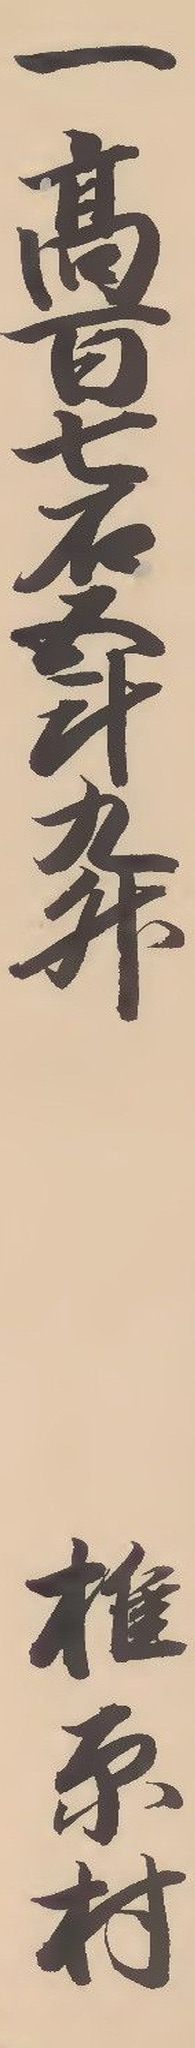一高百七石五斗九升椎原村
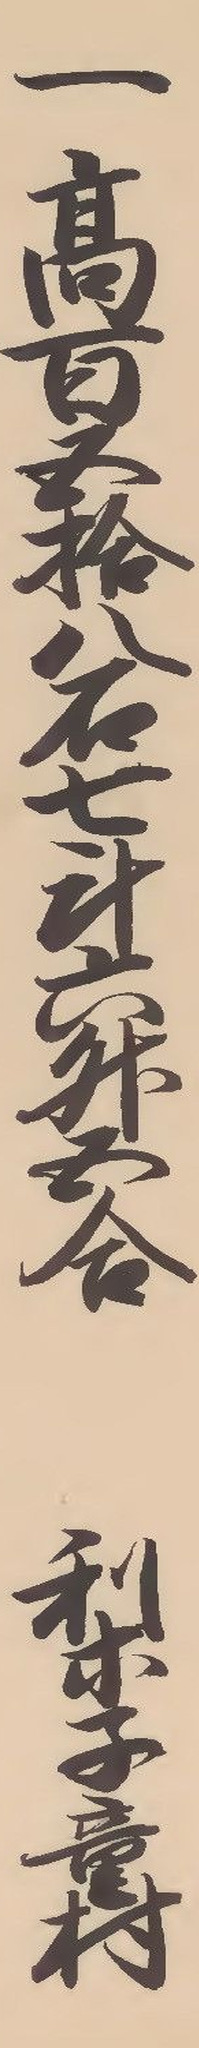一高百五拾八石七斗六升五合梨子童村
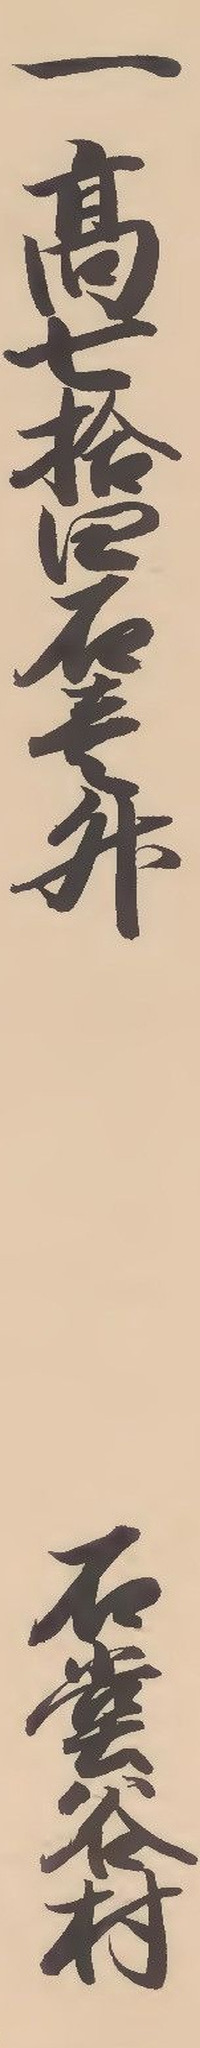一高七拾四石壱升石堂谷村
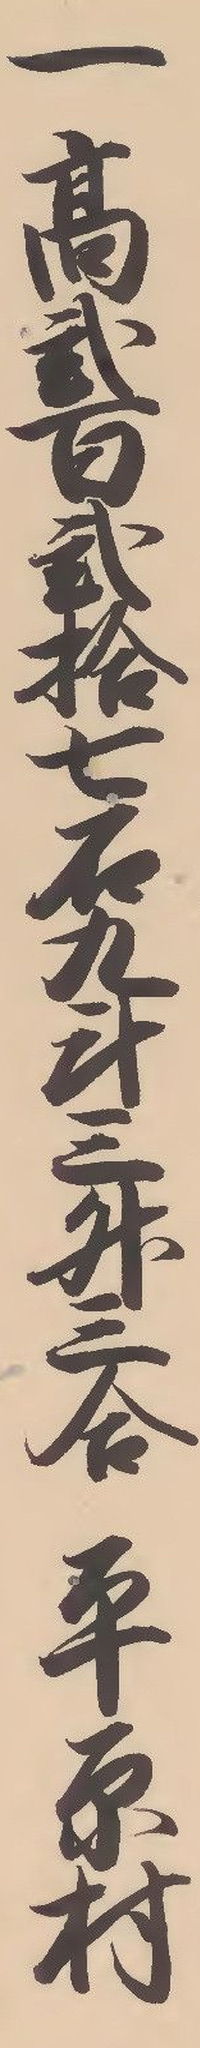一高弐百弐拾七石九斗三升三合平原村
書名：大和国郷帳
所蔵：国立公文書館 National Archives of Japan
